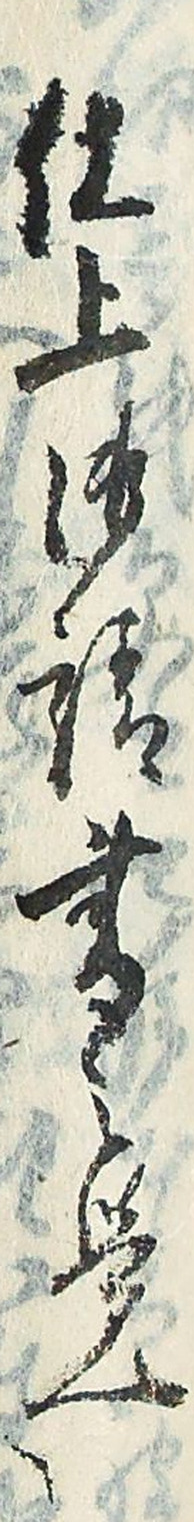仕上御請書之覚
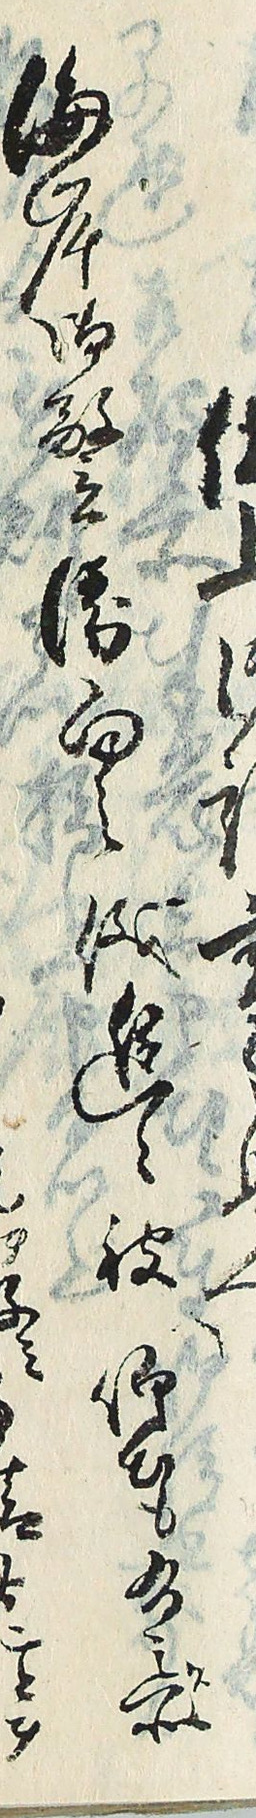海岸御警衛向之儀追々被仰出も有之候所
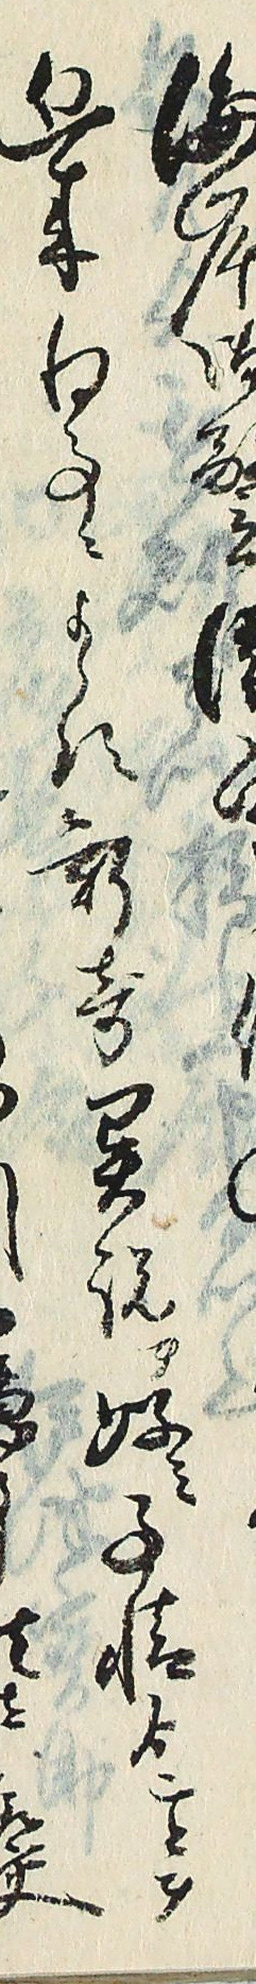近来何事によらす新奇異説を好み事情ゟ意を
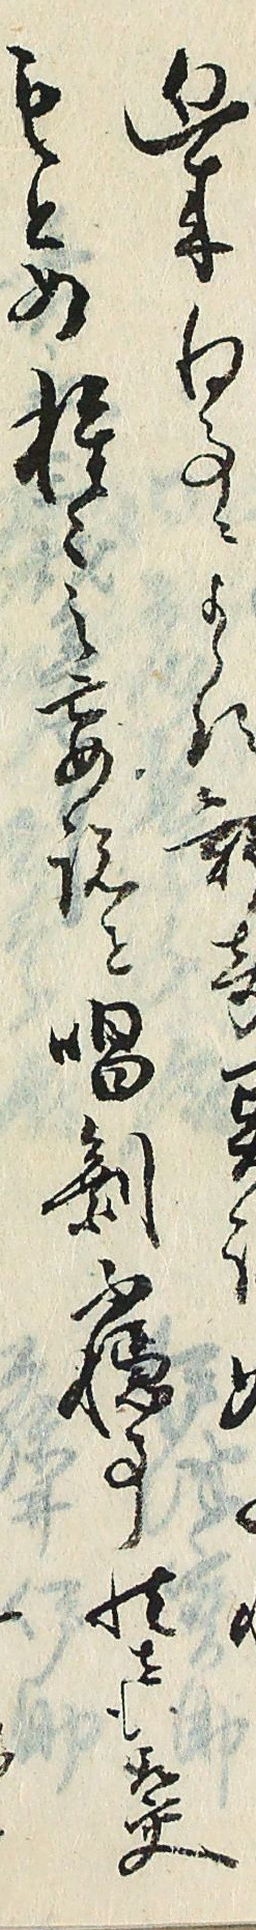もとめ種々之妄説を唱剰不穏事共をも取交
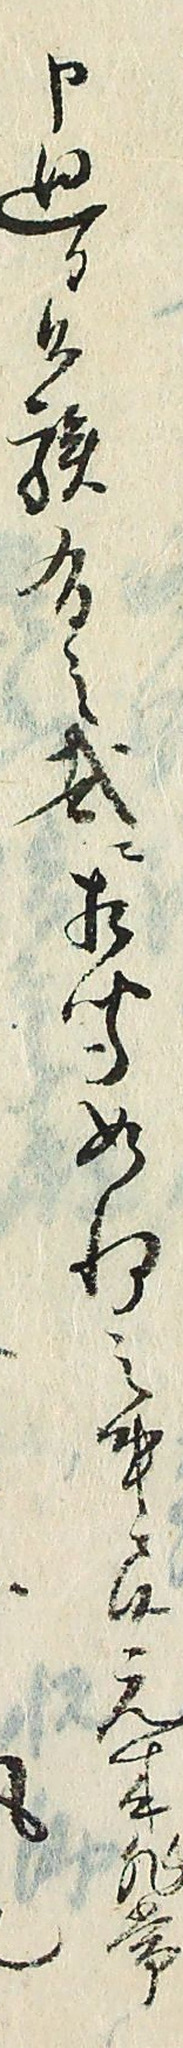申廻り候族有之義に相聞如何之事に候元来非常
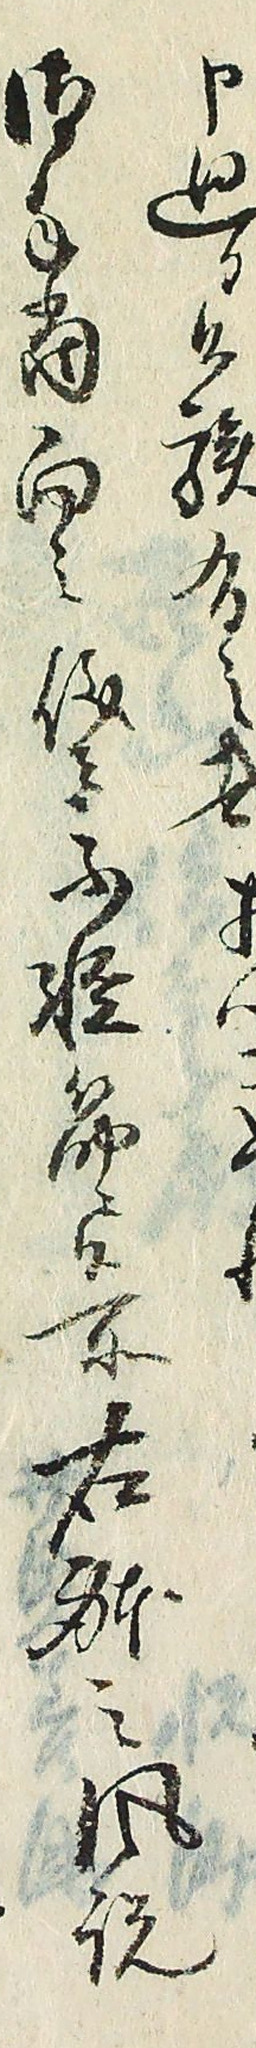御手当向之儀は不軽筋に候所右体之風説
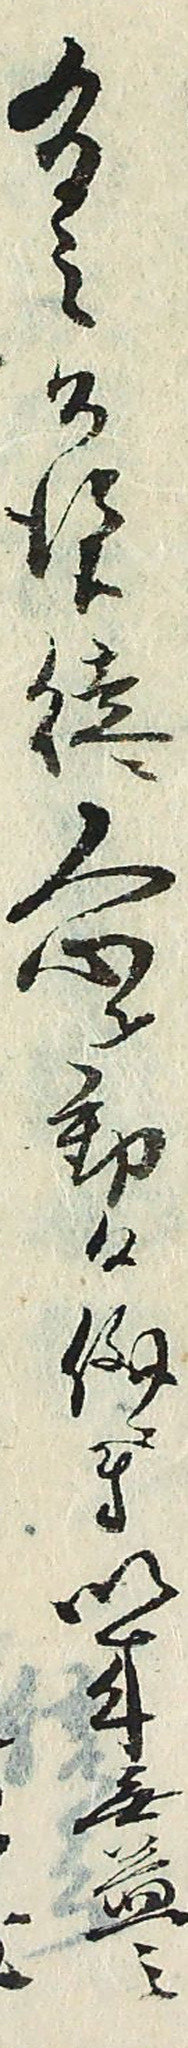有之候得は徒に人心を動候儀に付以来無益之
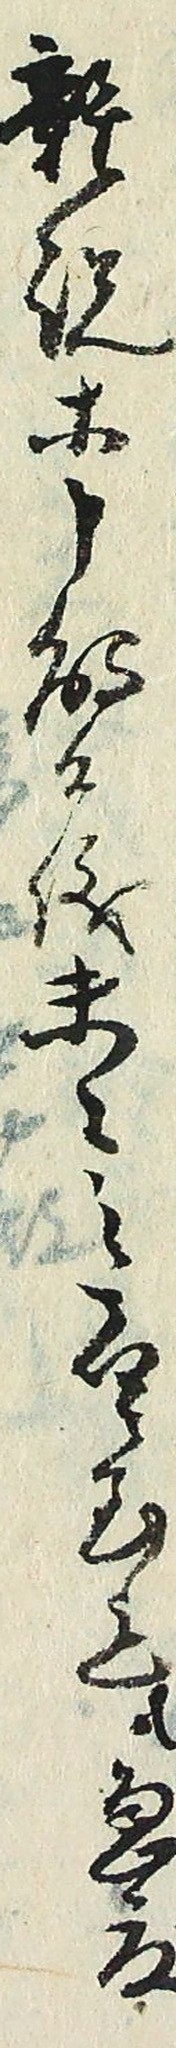雑説等申触候儀末々之者に至迄も急度
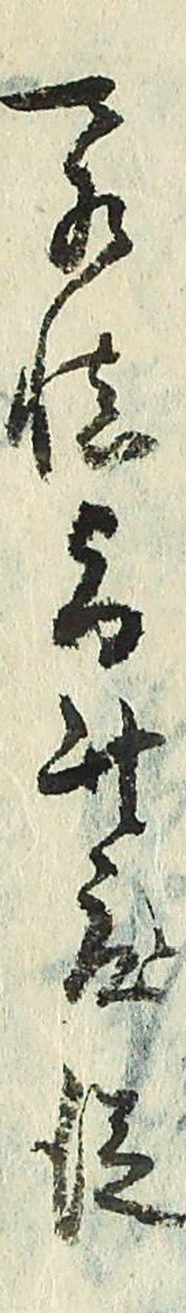可相慎旨此度従
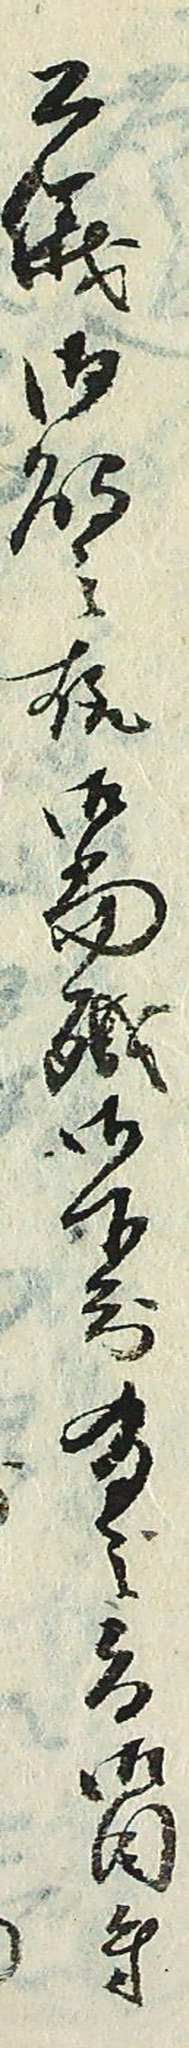公儀御触之趣御当職御下知有之旨御目付
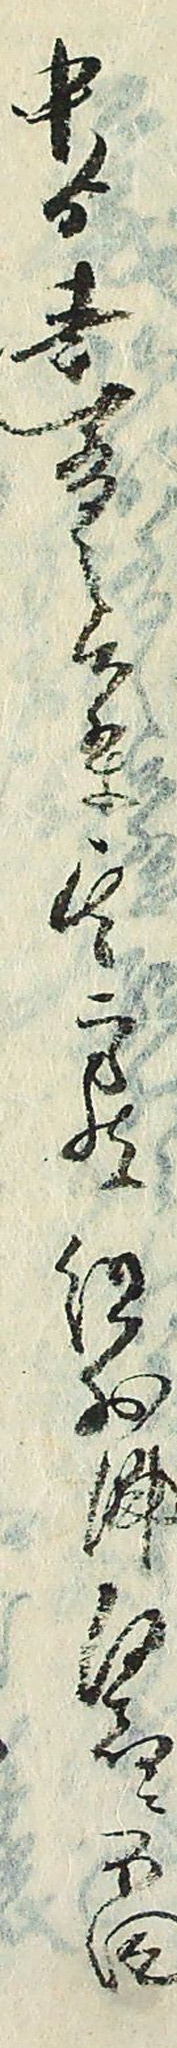中ゟ達有之候条其方共組村浦何者に不因
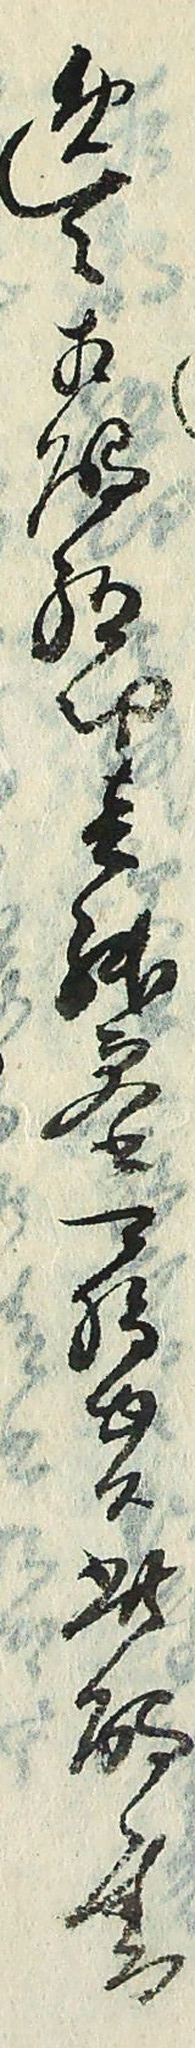逸々相触組切壱紙受書可指出候此触書
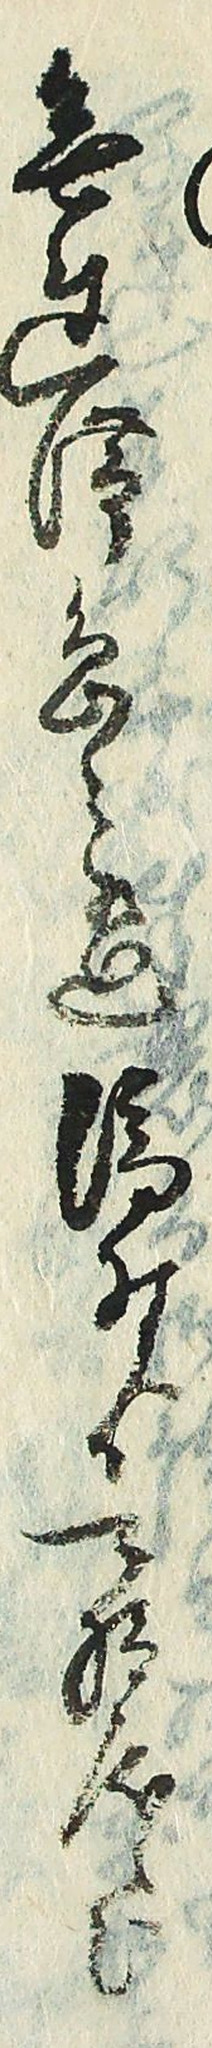無遅滞急々相廻済村ゟ可指戻以上
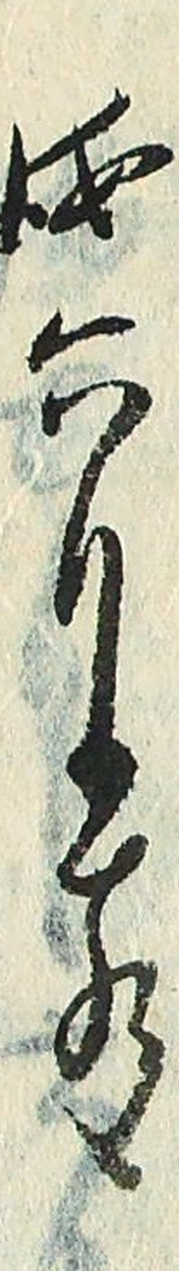戌六月十九日
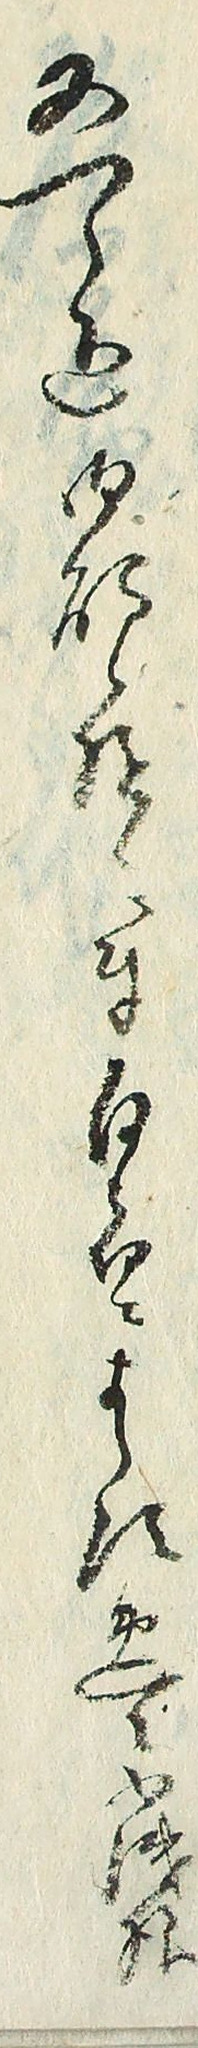右之通御触被遊候に付何者によらす逸々不洩様

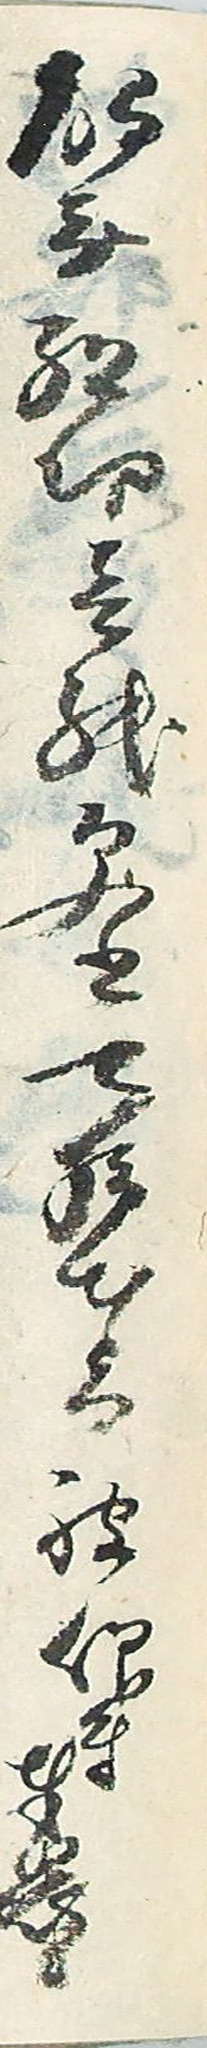触知組切壱紙受書可指出旨被仰付奉畏候
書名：諸御用御□受書控
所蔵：鳴門教育大学 Naruto University of Education
